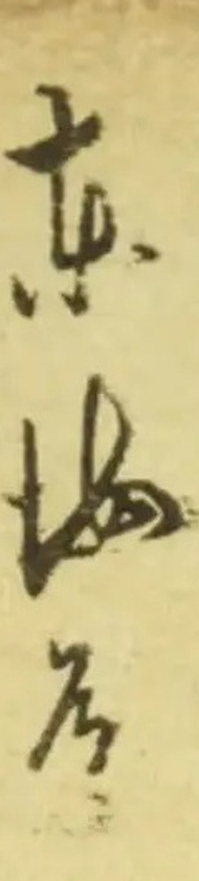東海道
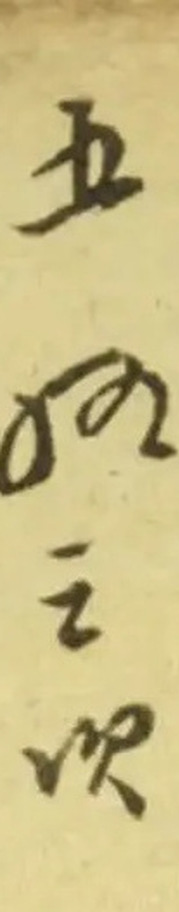五拾三次
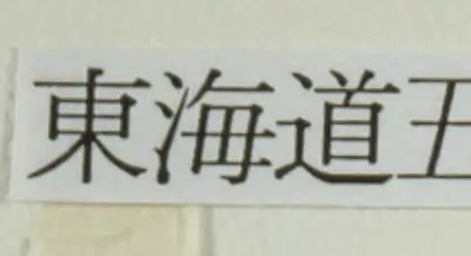東海道
